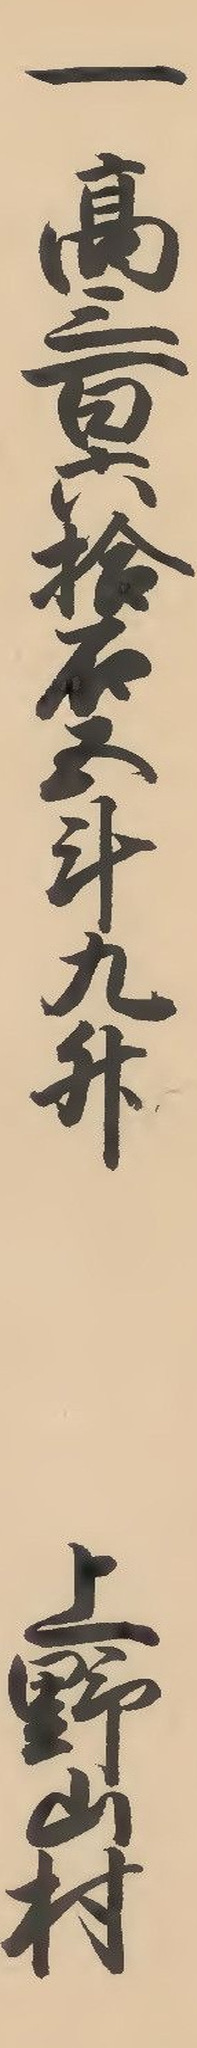一高三百六拾石五斗九升上野山村
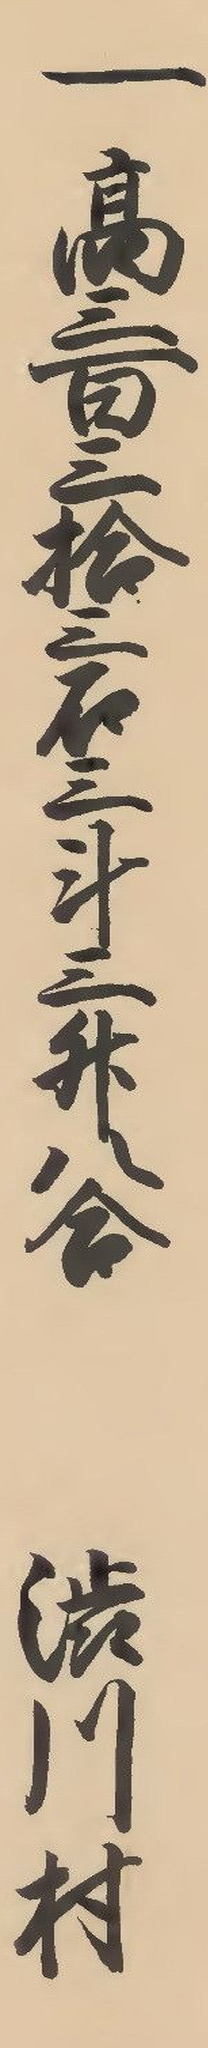一高三百三拾三石三斗三升八合渋川村
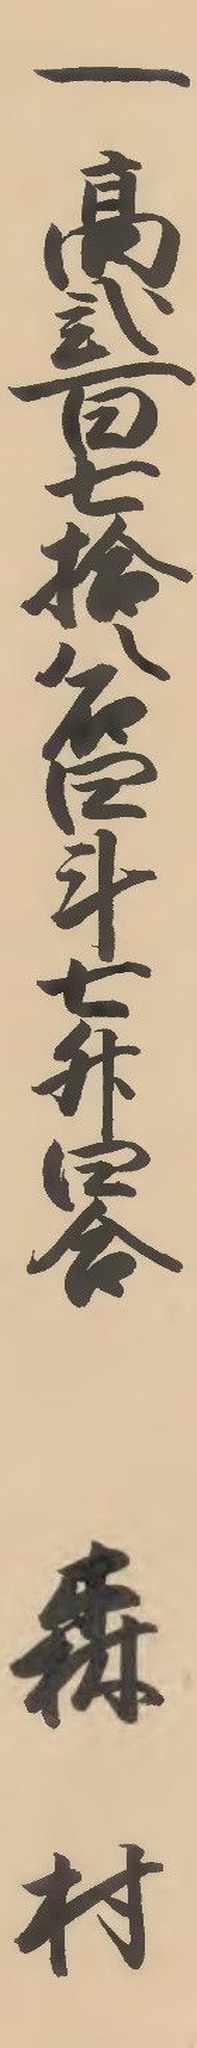一高弐百七拾八石四斗七升四合森村
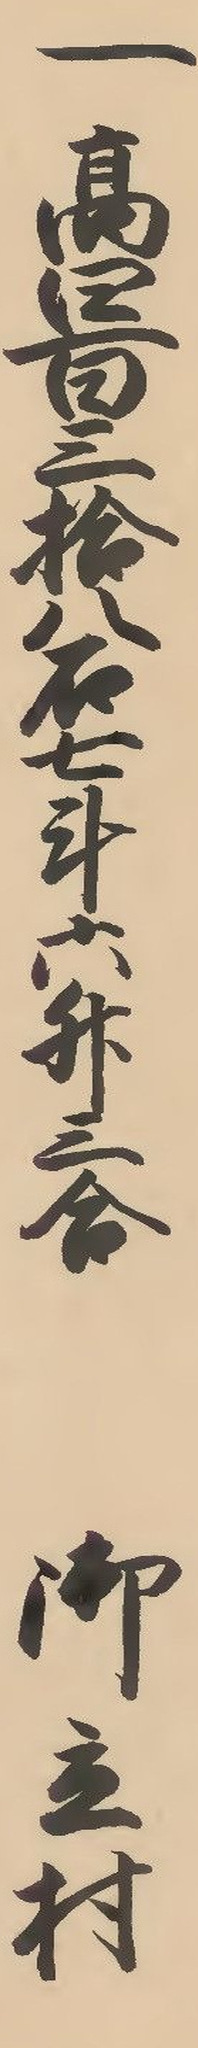一高四百三拾八石七斗六升三合御立村
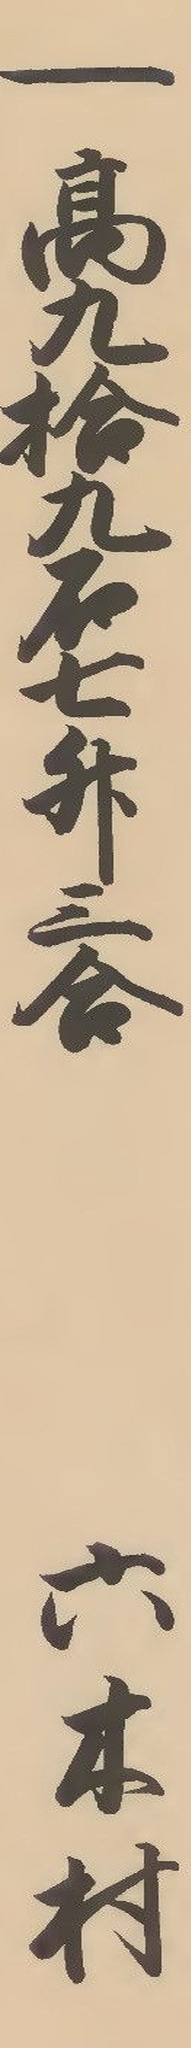一高九拾九石七升三合六木村
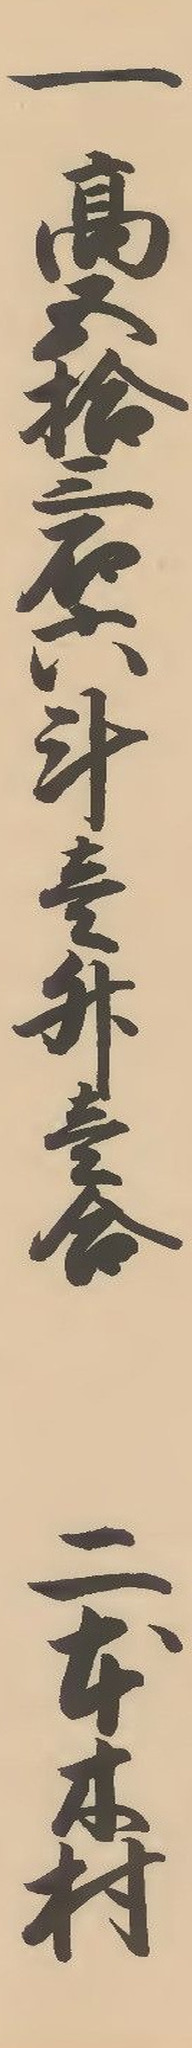一高五拾三石六斗壱升壱合二本木村
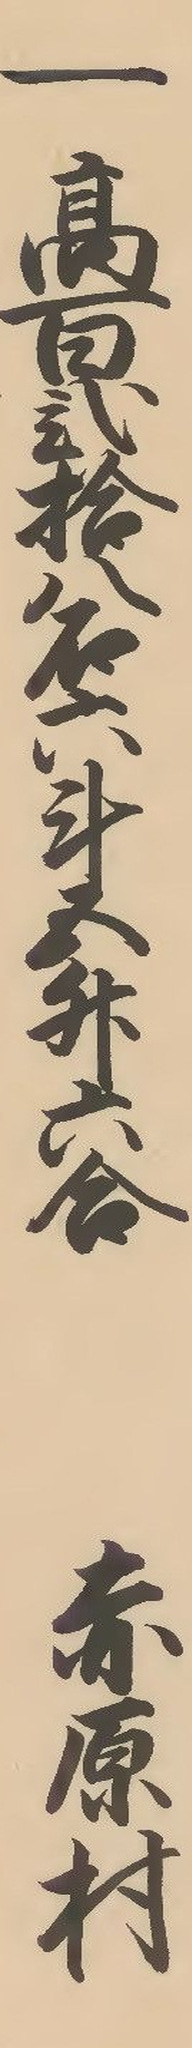一高百弐拾八石六斗五升六合赤原村

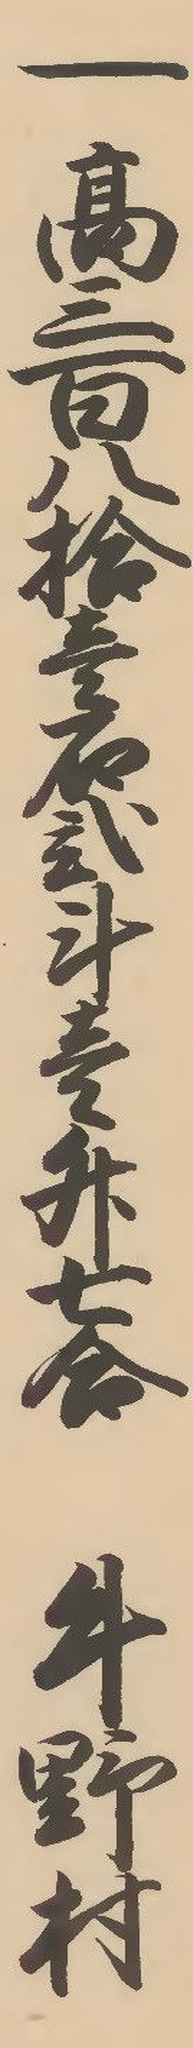一高三百八拾壱石弐斗壱升七合牛野村
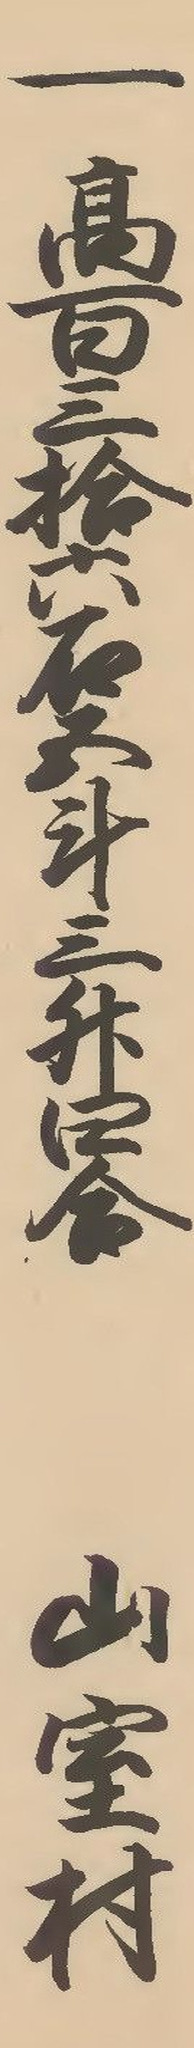一高百三拾六石五斗三升四合山室村
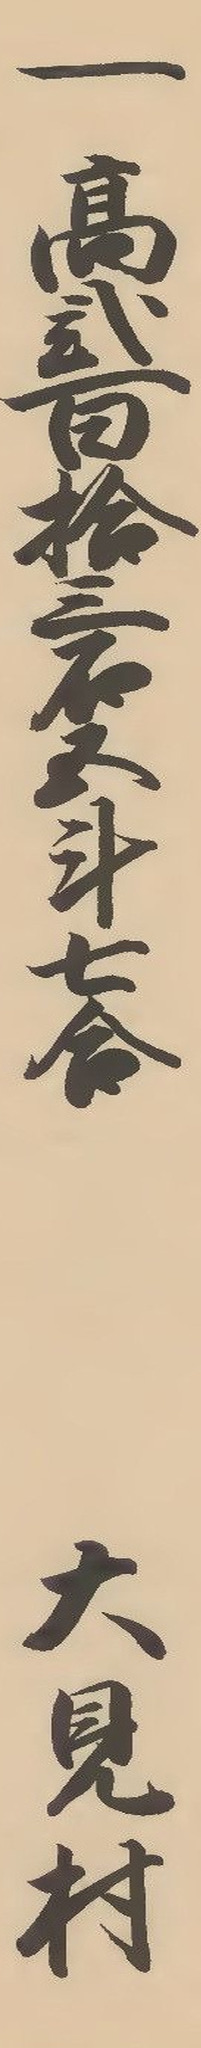一高弐百拾三石五斗七合大見村
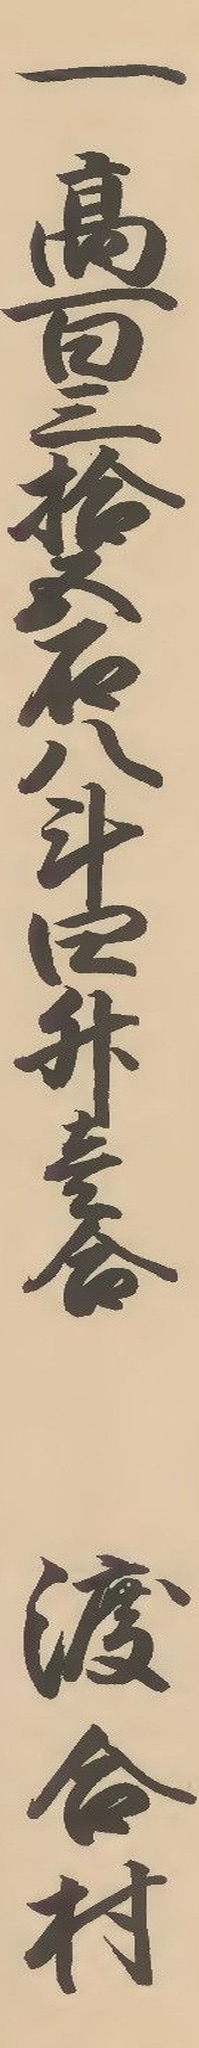一高百三拾五石八斗四升壱合渡合村
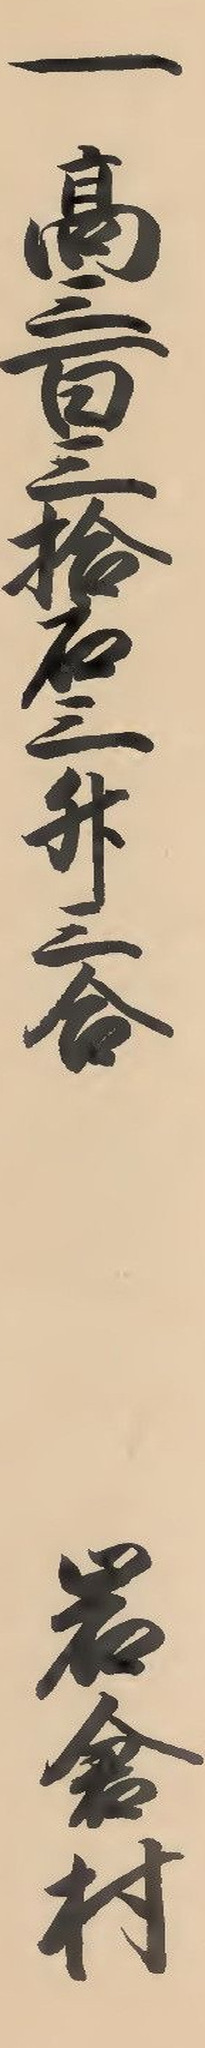一高三百三拾石三升三合岩倉村
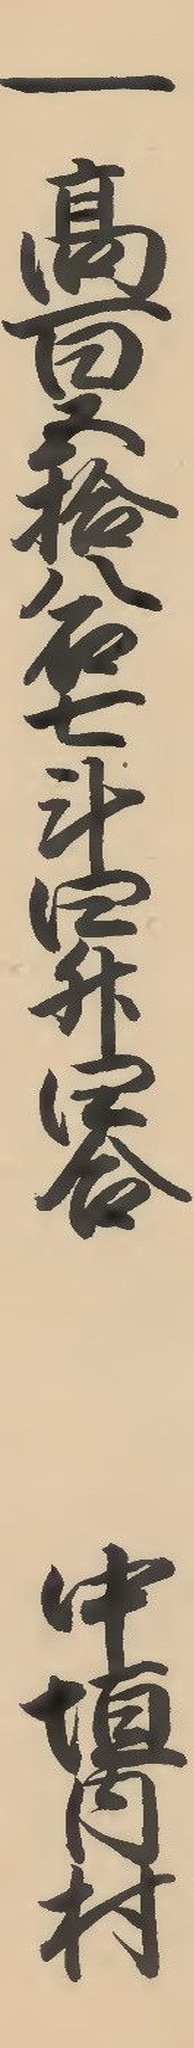一高百五拾八石七斗四升四合中垣内村
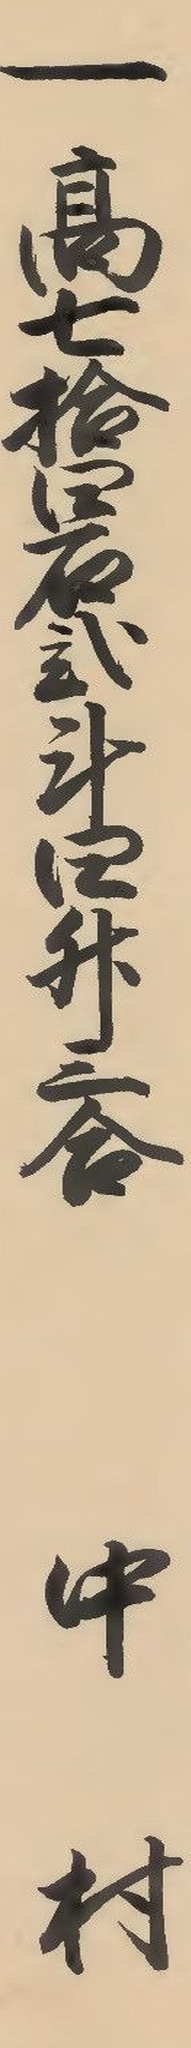一高七拾四石弐斗四升三合中村
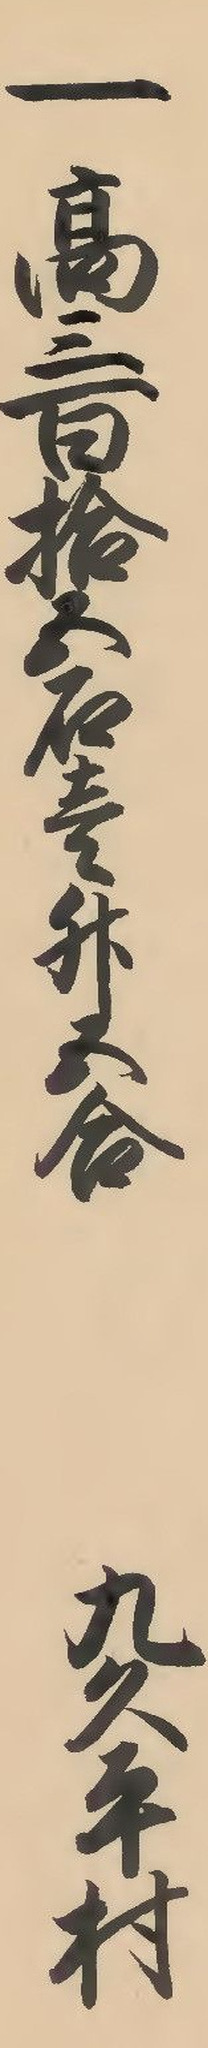一高三百拾五石壱升五合九久平村

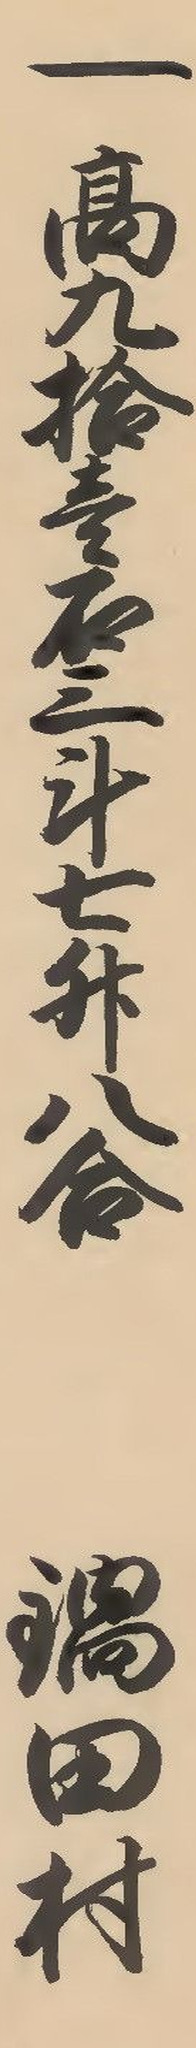一高九拾壱石三斗七升八合鍋田村
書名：三河国郷帳
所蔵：国立公文書館 National Archives of Japan
